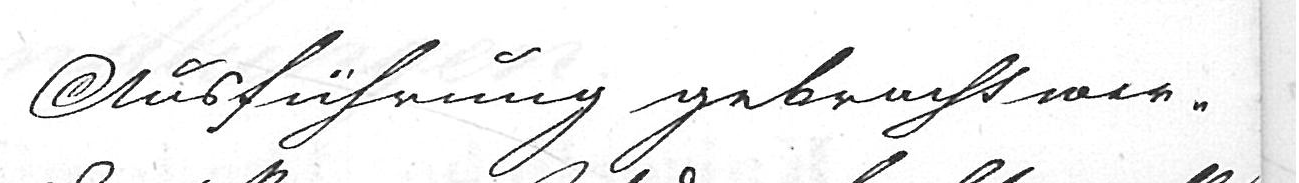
Ausführung gebracht wer-
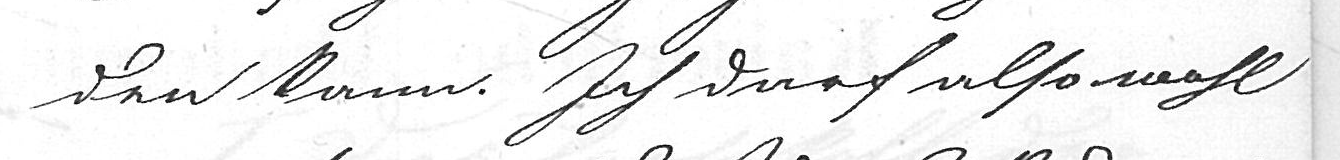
den kann. Ich darf also wohl
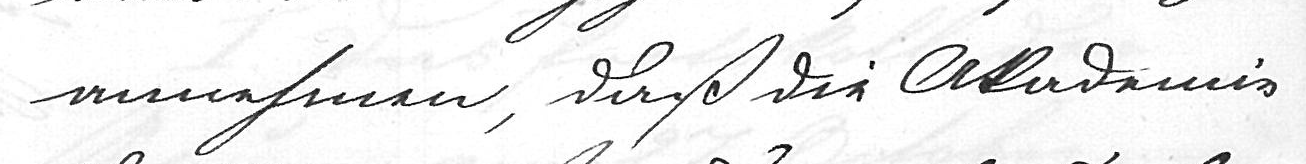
annehmen, daß die Akademie
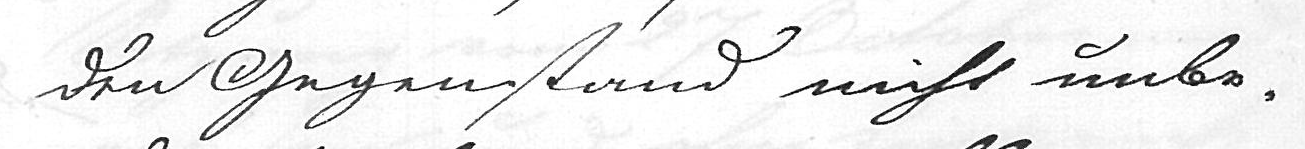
den Gegenstand nicht unbe-
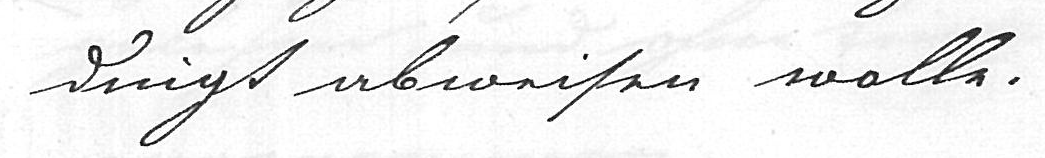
dingt abweisen wolle.
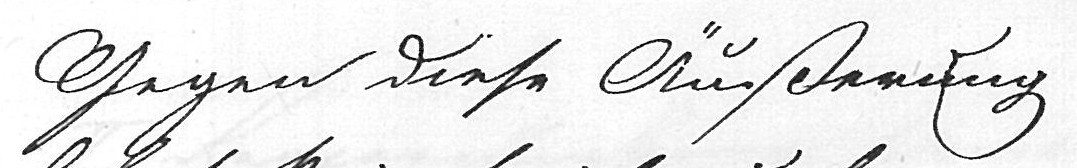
Gegen diese Äußerung
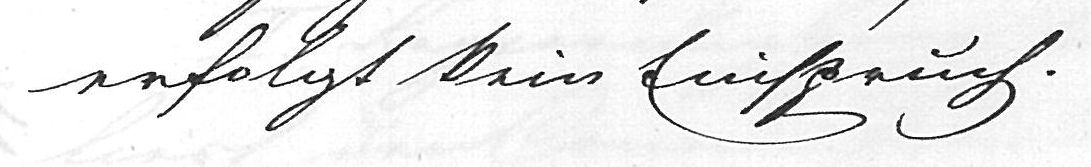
erfolgte kein Einspruch.
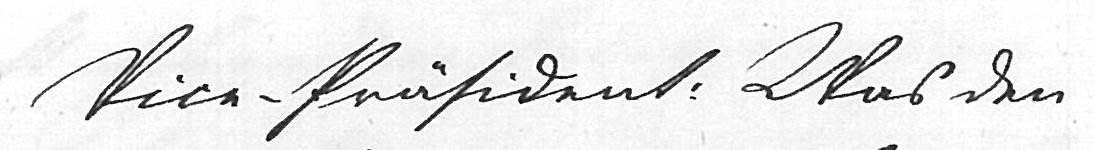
Vice-Präsident: Was den
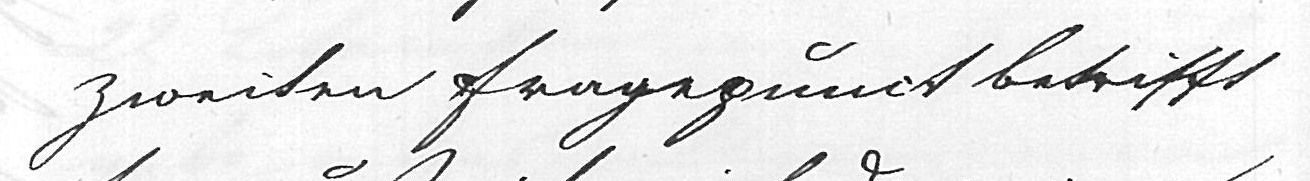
zweiten Fragepunct betrifft
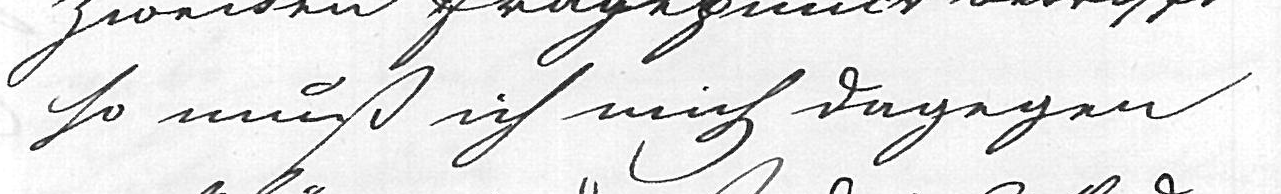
so muß ich mich dagegen
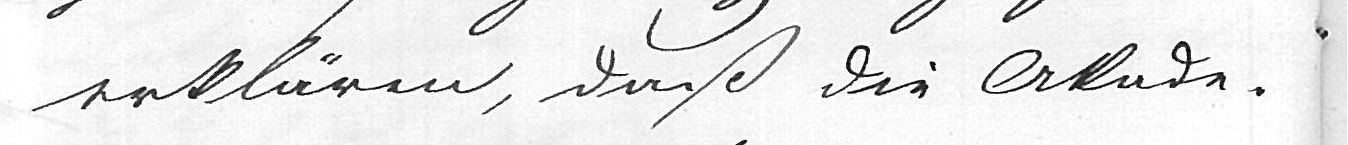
erklären, daß die Akade-
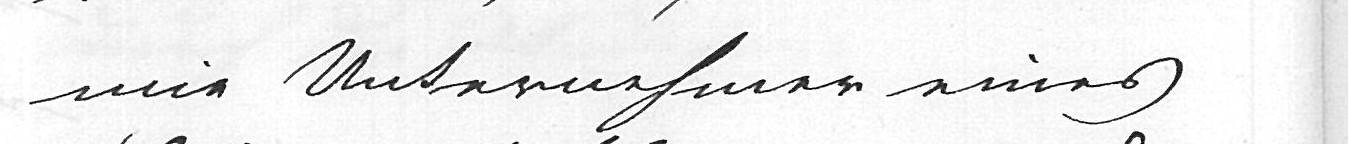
mie Unternehmer eines
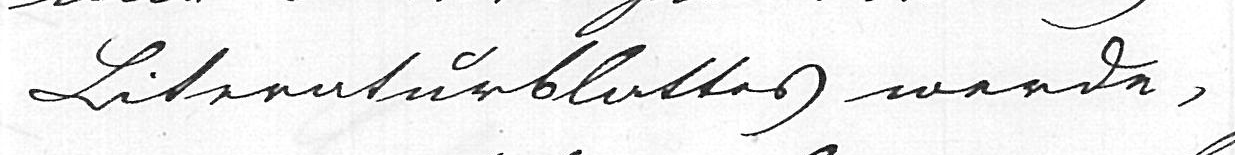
Literaturblattes werde,
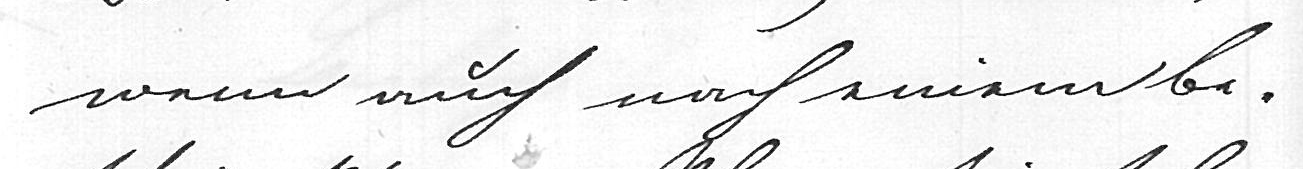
wenn auch nach einem be-
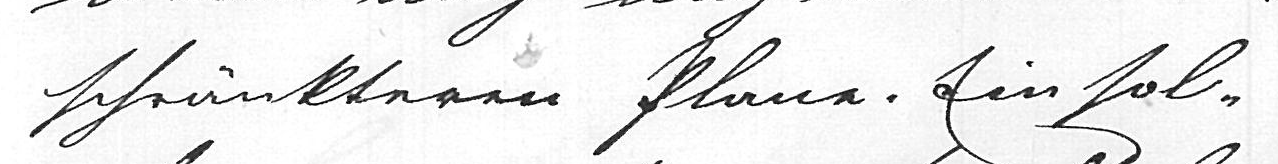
schränkteren Plane. Ein sol-
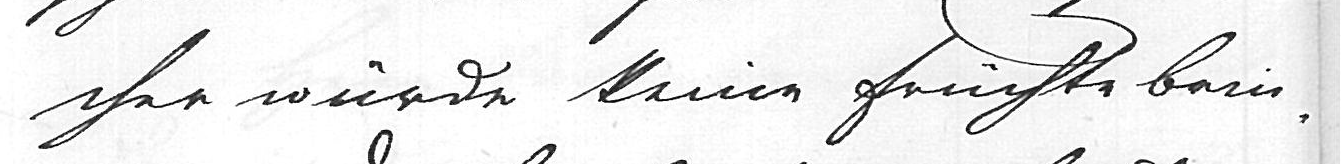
cher würde keine Früchte brin-
